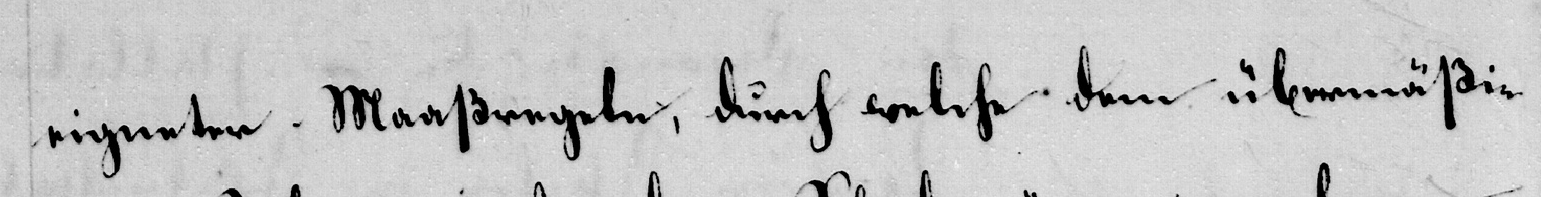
eigneter Maaßregeln, durch welche dem übermäßi¬
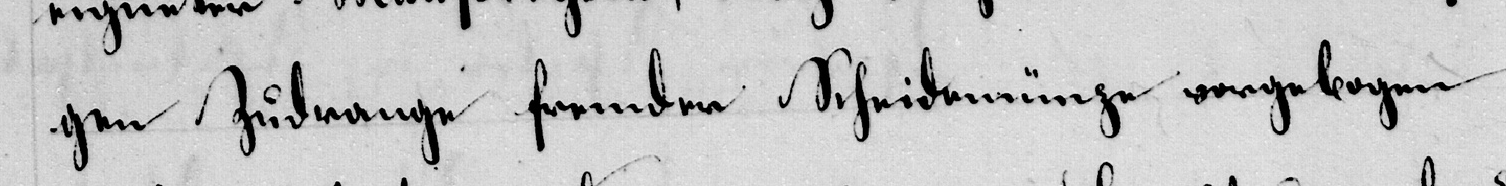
gen Zudrange fremder Scheidemünze vorgebogen
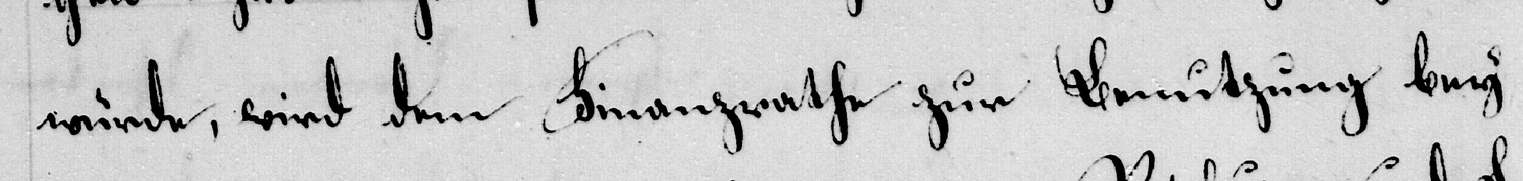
würde, wird dem Finanzrathe zur Benutzung bey
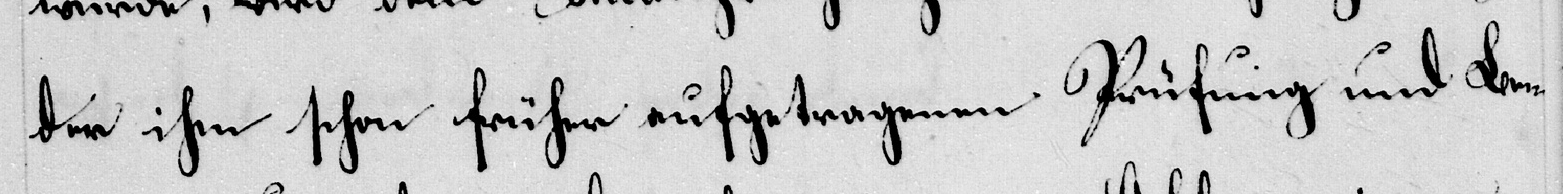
der ihm schon früher aufgetragenen Prüfung und Be¬
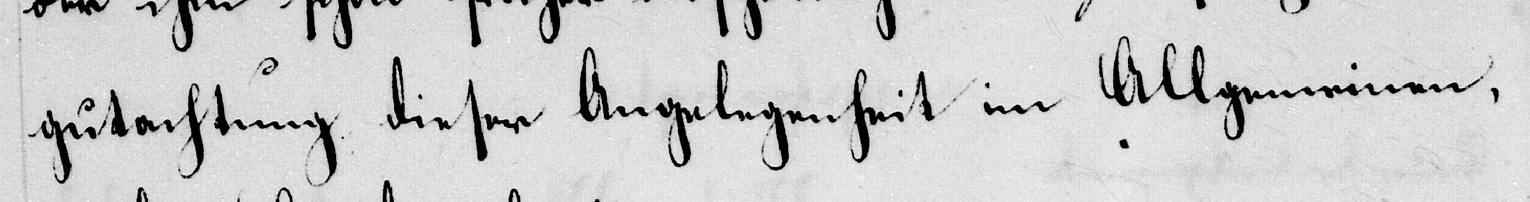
gutachtung dieser Angelegenheit im Allgemeinen,
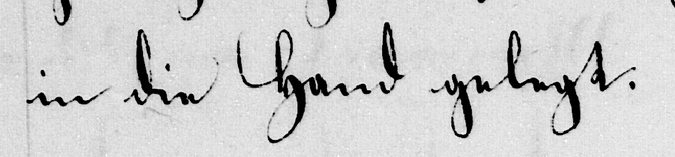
in die Hand gelegt.
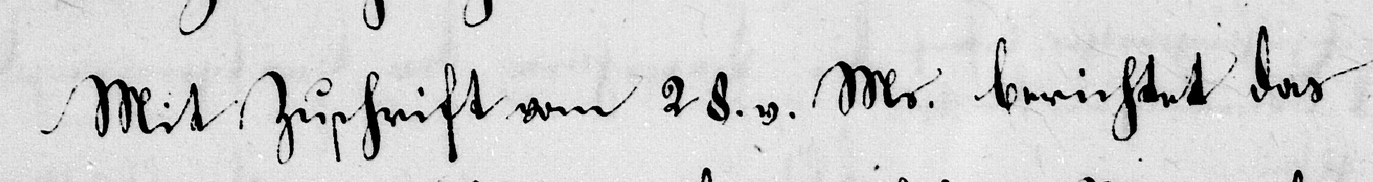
Mit Zuschrift vom 28. v. Ms. berichtet das
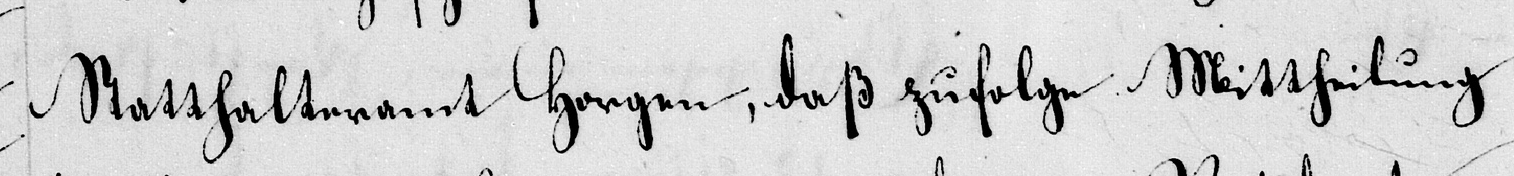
Statthalteramt Horgen, daß zufolge Mittheilung
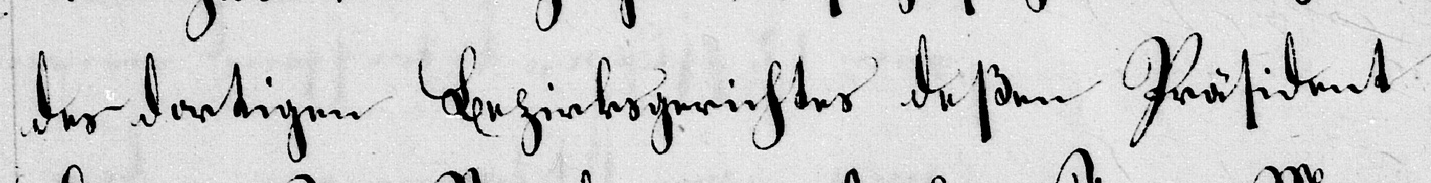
des dortigen Bezirksgerichtes deßen Präsident
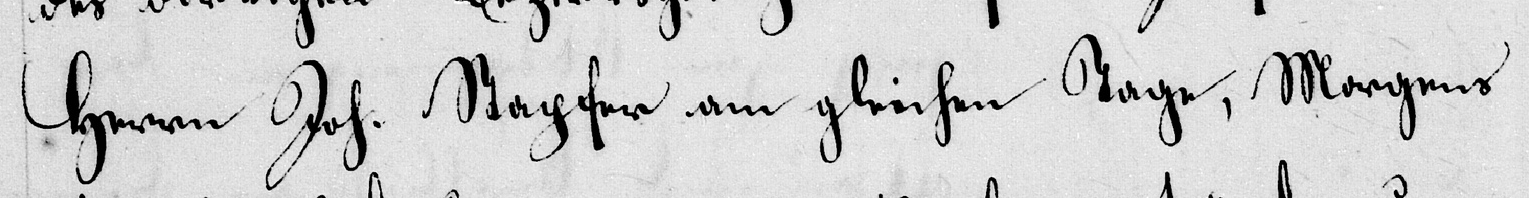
Herrn Joh. Stapfer am gleichen Tage, Morgens
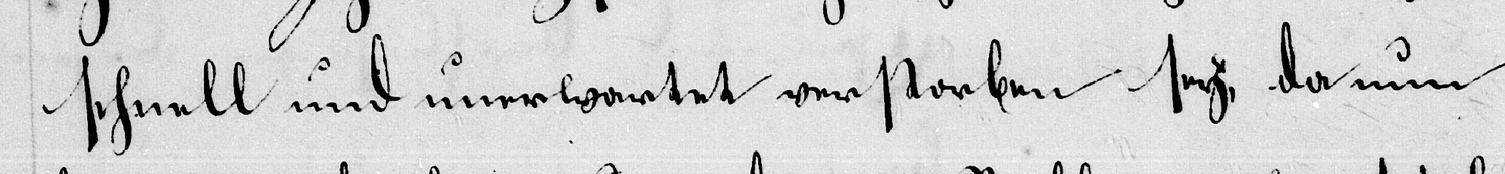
schnell und unerwartet verstorben sey, da nun
